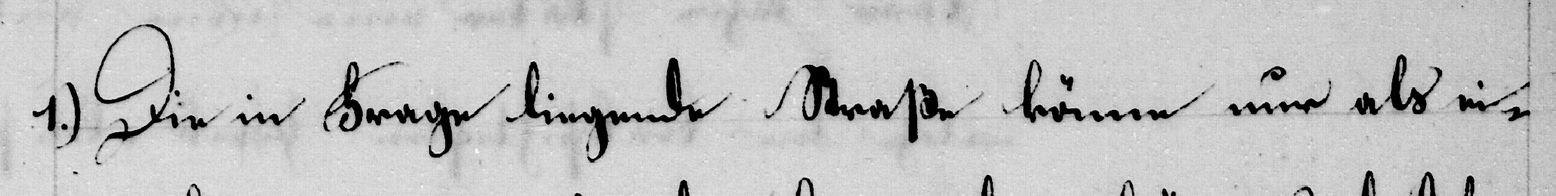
1.) Die in Frage liegende Straße könne nur als e¬
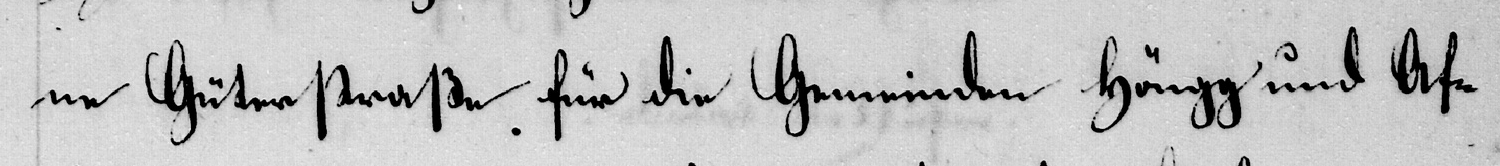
ine Güterstraße für die Gemeinden Höngg und Af¬
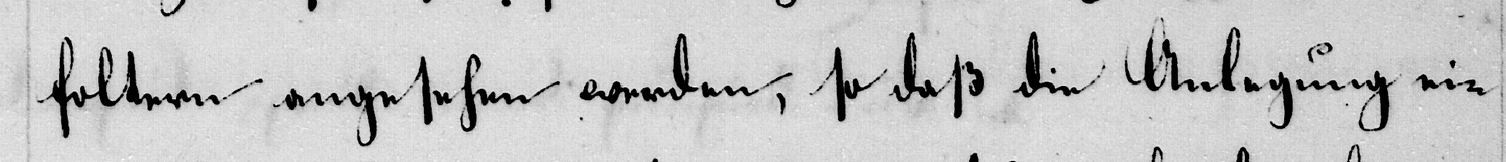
foltern angesehen werden, so daß die Anlegung ei¬
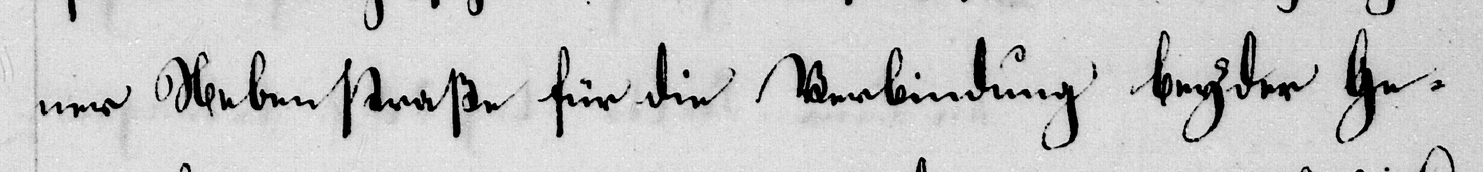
ner Nebenstraße für die Verbindung beyder Ge¬
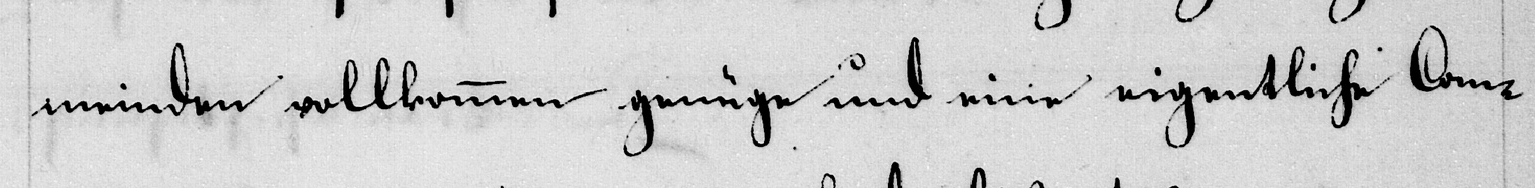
meinden vollkommen genüge und eine eigentliche Com¬
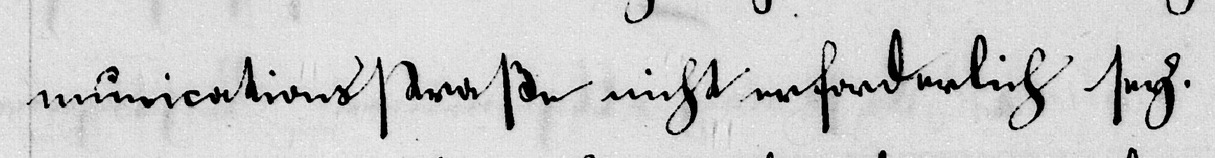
municationsstraße nicht erforderlich sey.
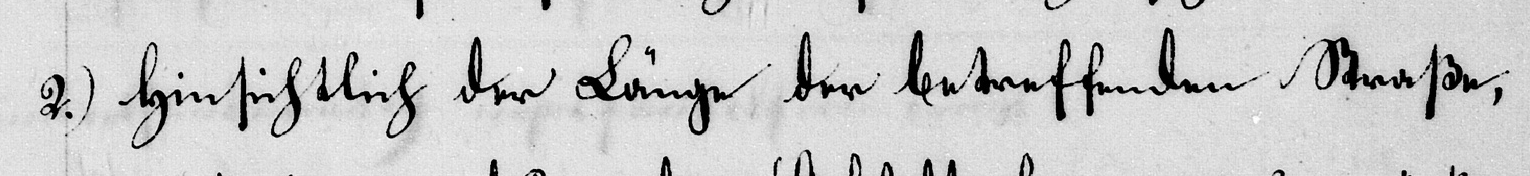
2.) Hinsichtlich der Länge der betreffenden Straße,
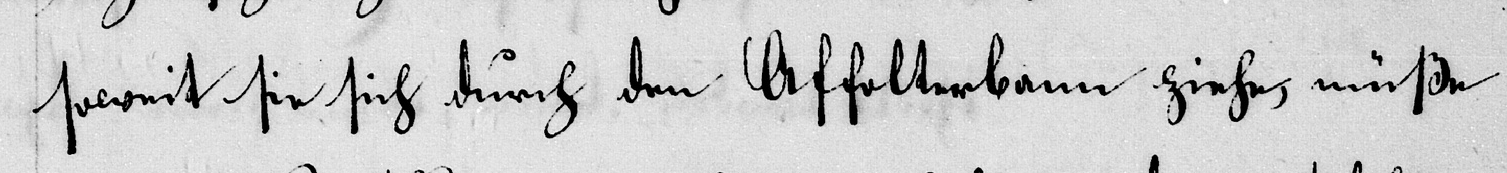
soweit sie sich durch den Affolterbann ziehe, müße
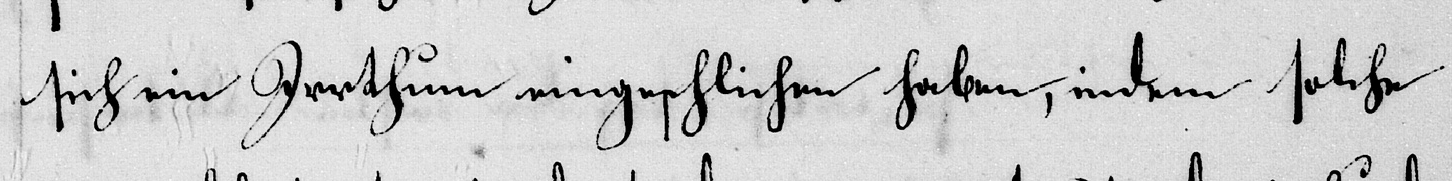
sich ein Irrthum eingeschlichen haben, indem solche
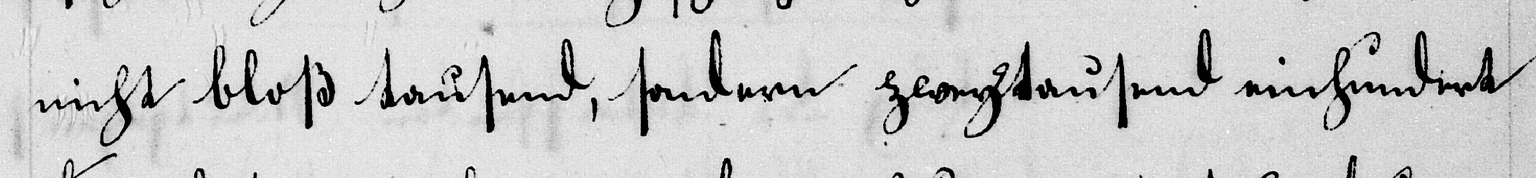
nicht bloß tausend, sondern zweytausend einhundert
